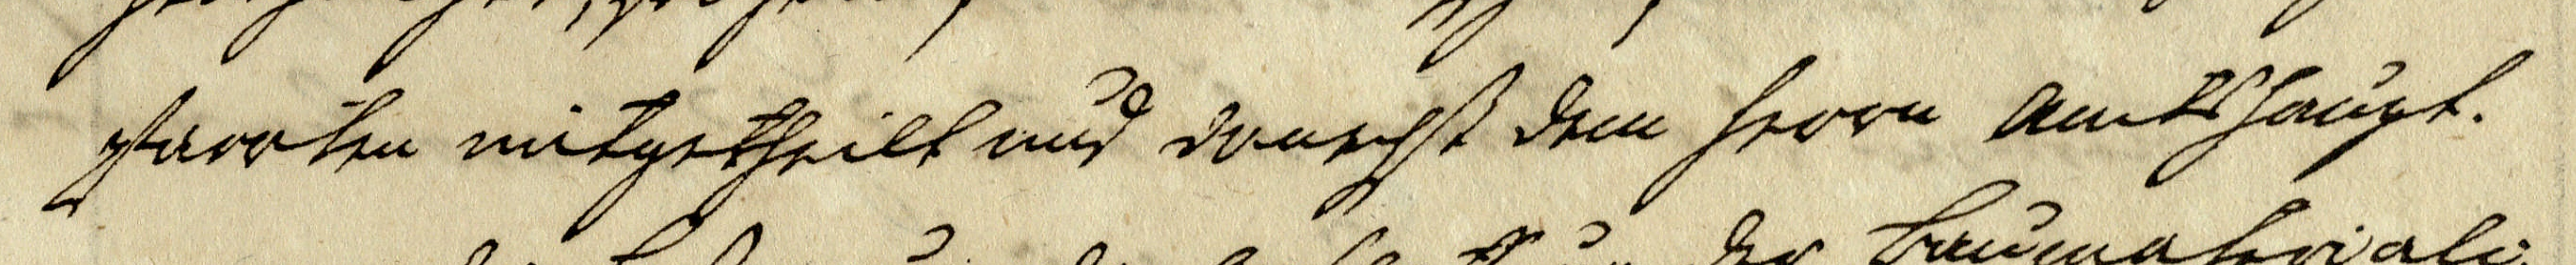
pfarrten mitgetheilt und danechst dem Herrn Amtshaupt¬
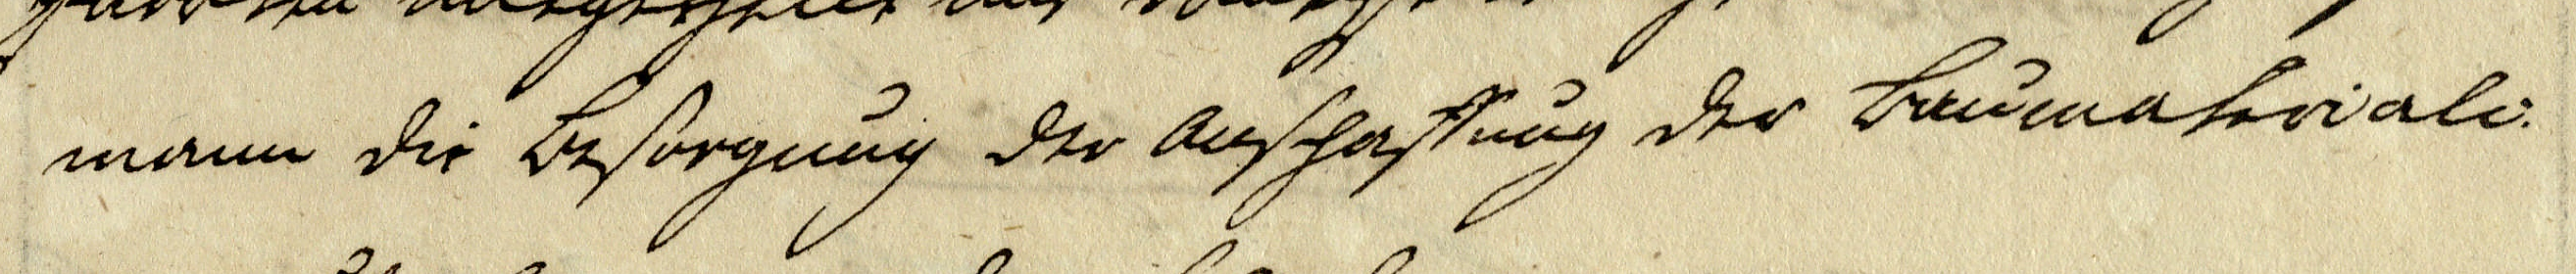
mann die Besorgung der Anschaffung der Baumateriali¬
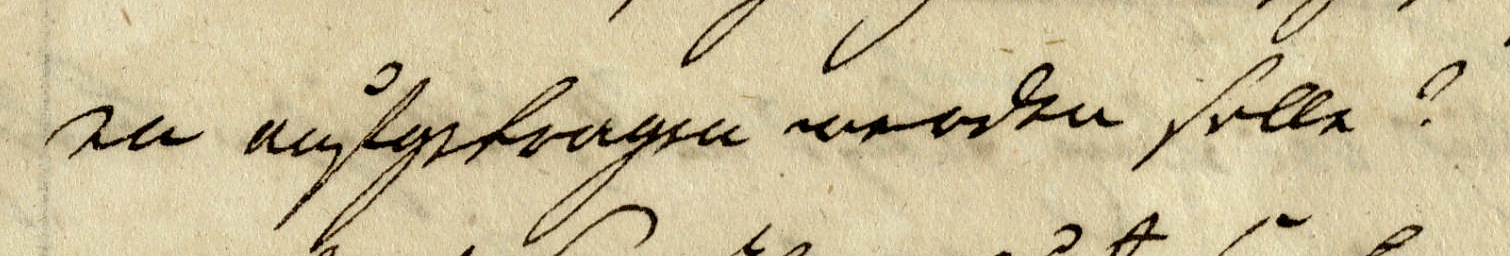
en aufgetragen werden solle?
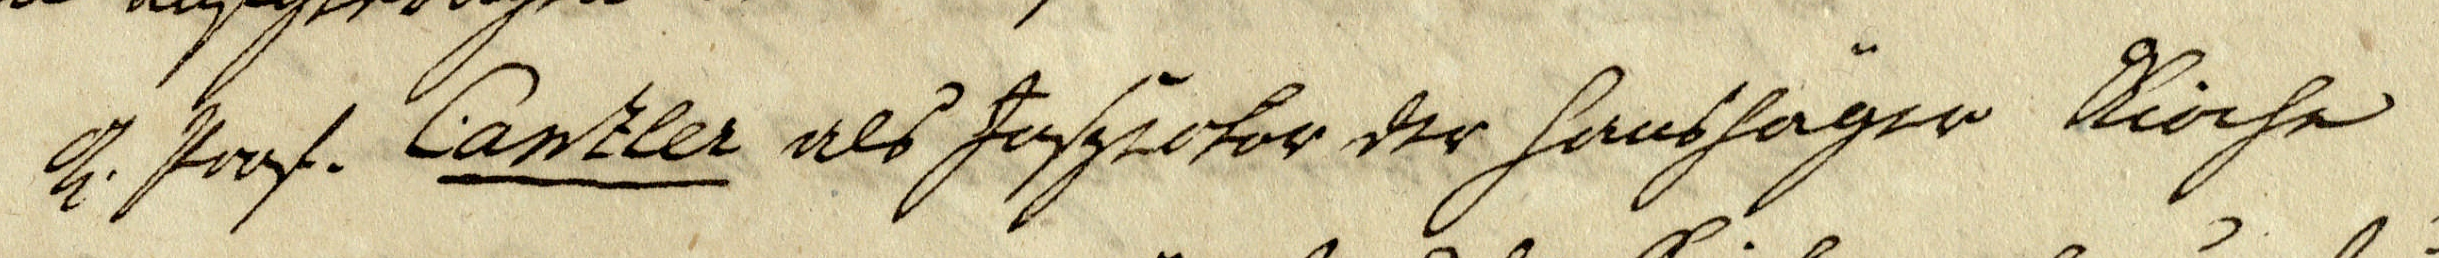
dh. Prof. Canzler als Inspector der Hanshäger Kirche
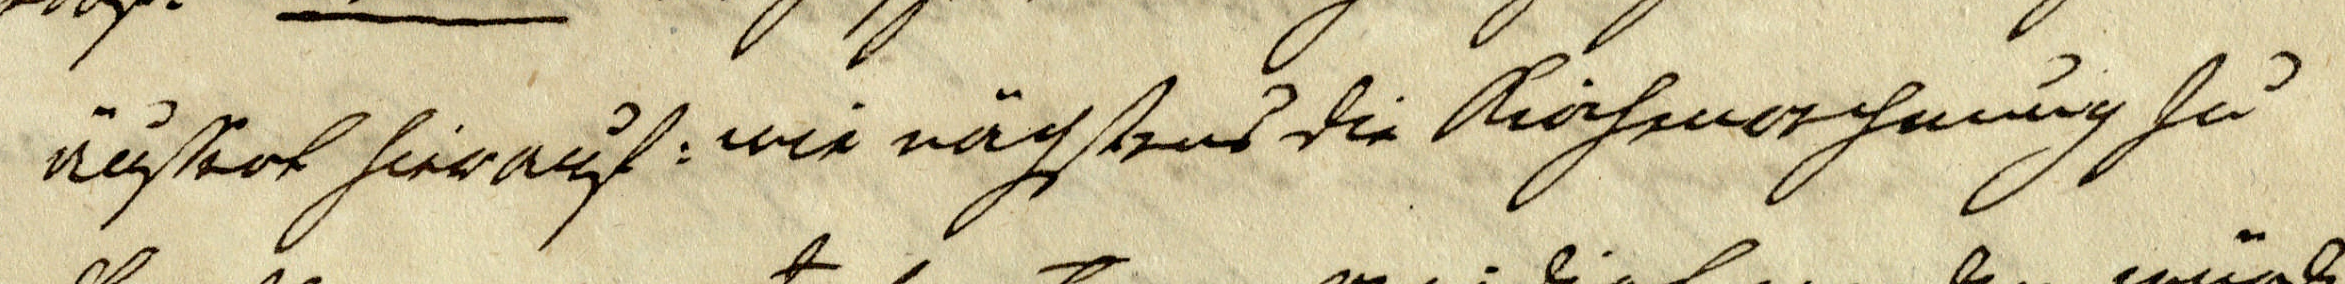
äussert hierauf wie nächstens die Kirchenrechnung zu
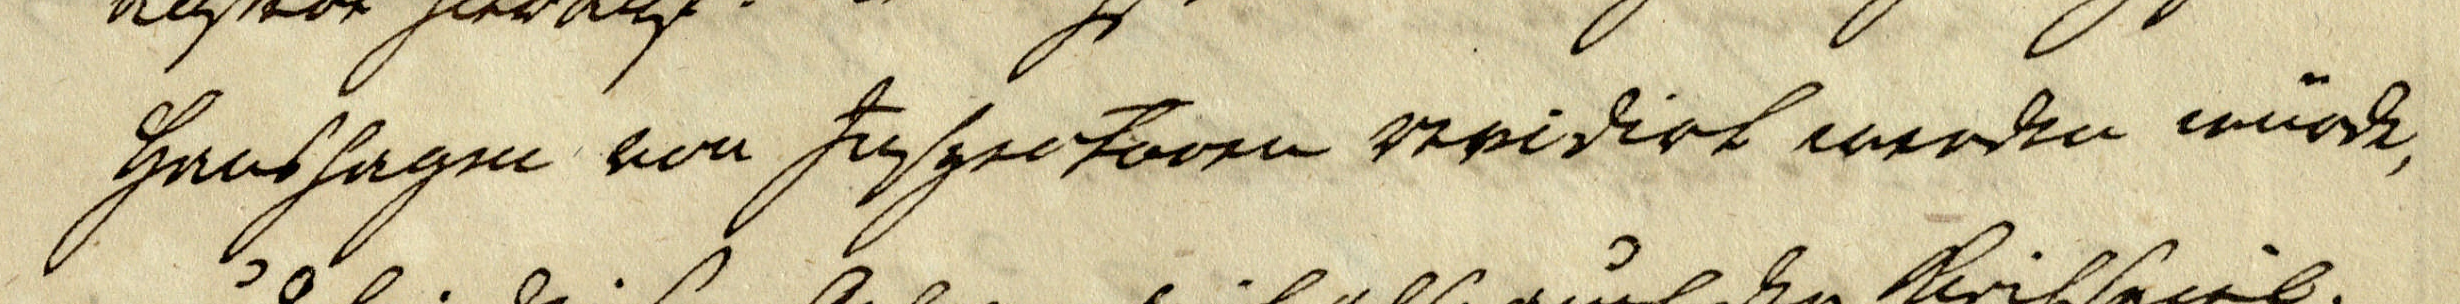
Hanshagen von Inspectoren revidirt werden würde,
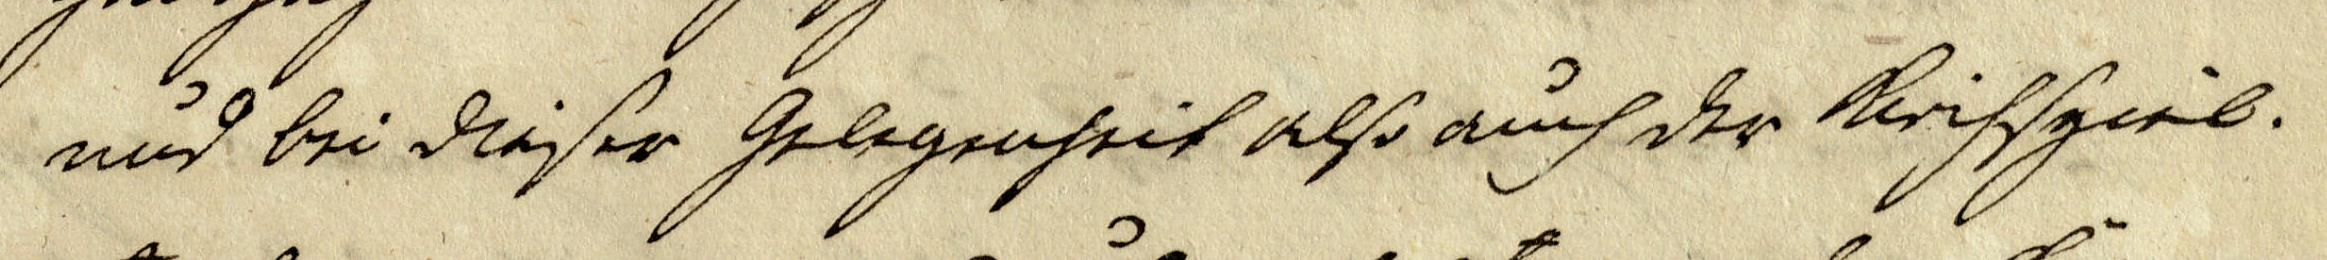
und bei dieser Gelegenheit also auch der Kirchspiel¬
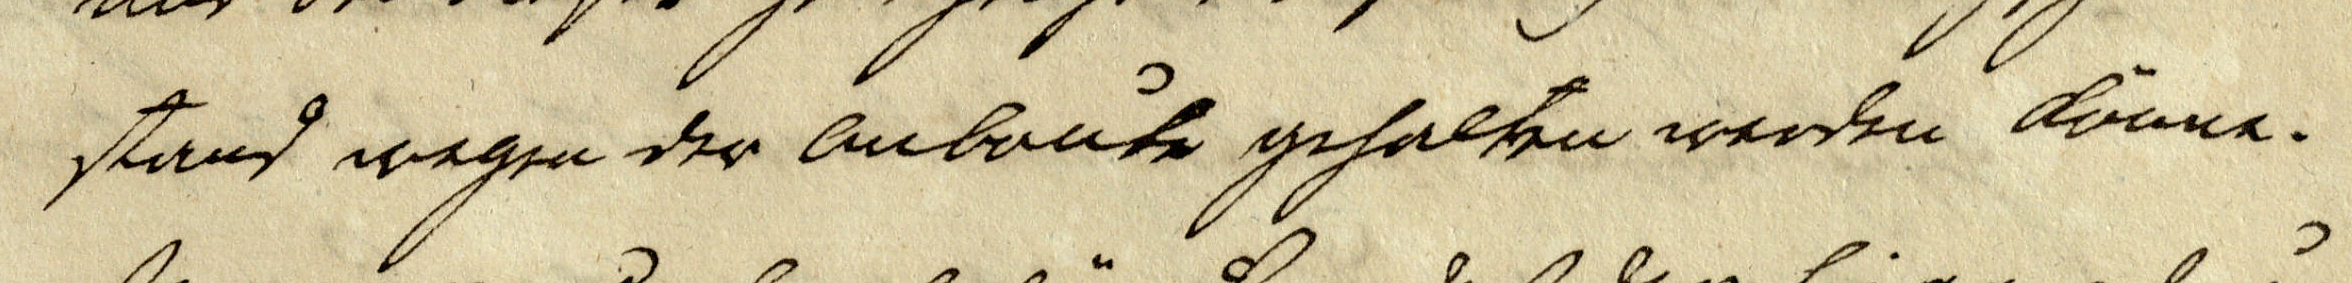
stand wegen der Anbaute gehalten werden könne.
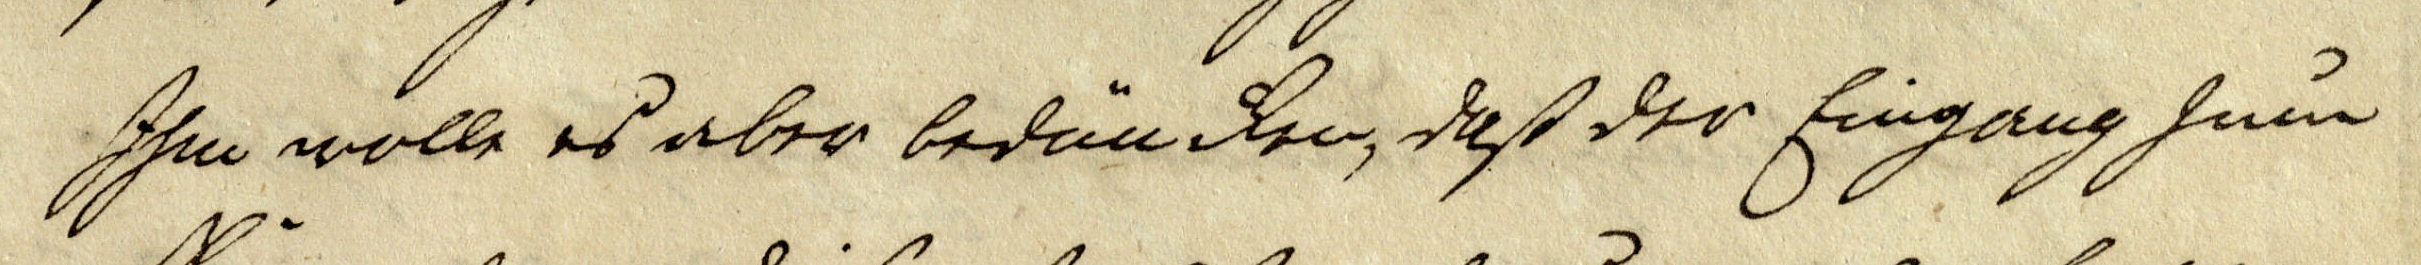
Ihm wolle es aber bedüncken, daß der Eingang zum
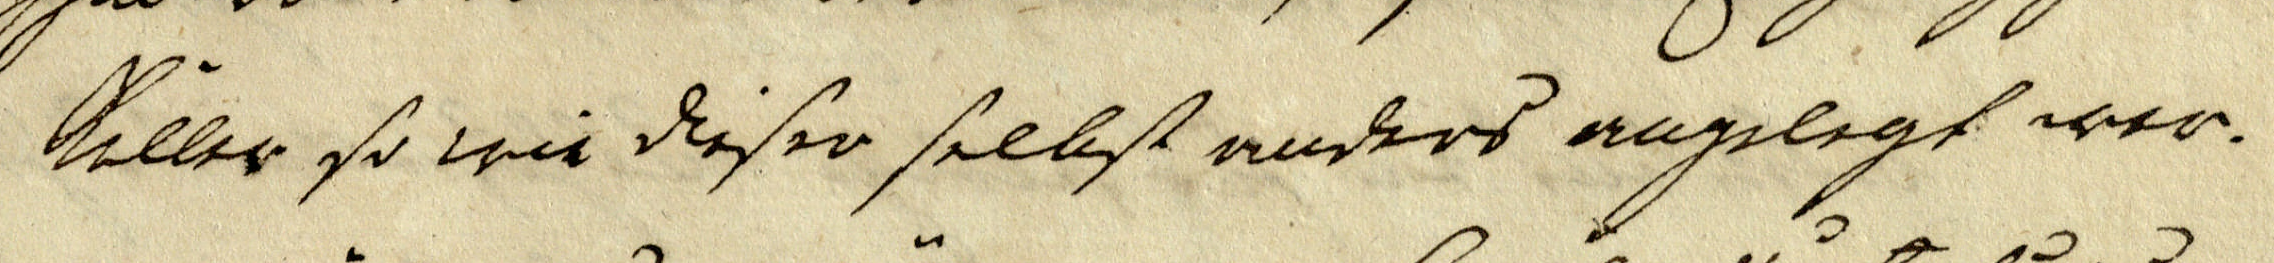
Keller so wie dieser selbst anders angelegt wer¬
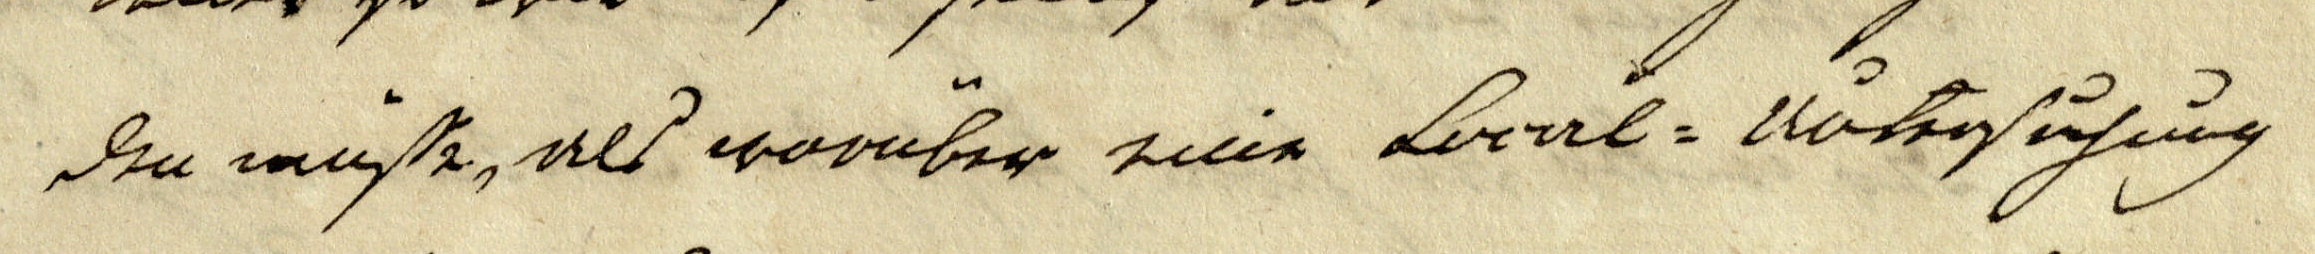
den müsse, als worüber eine Local- Untersuchung
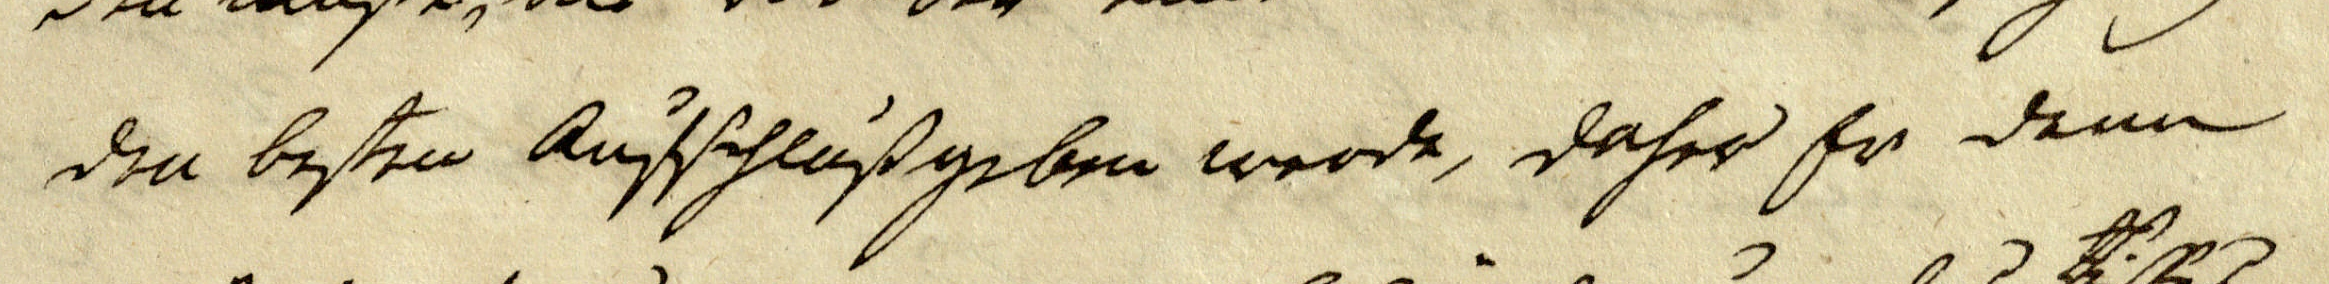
den besten Aufschluß geben werde, daher Er denn
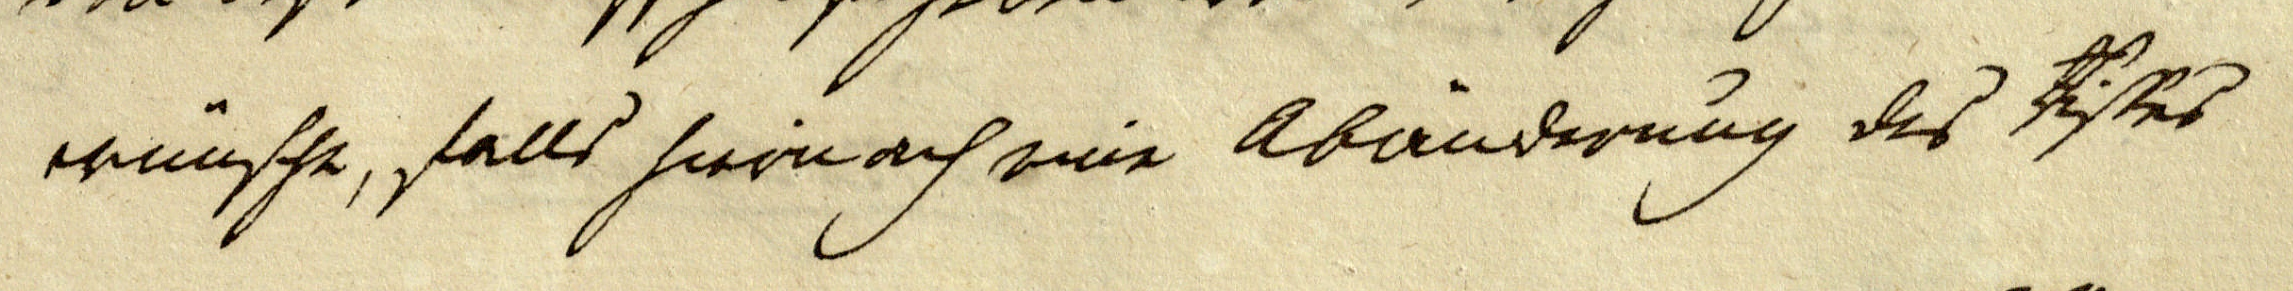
wünsche, falls hiernach eine Abänderung des Risses
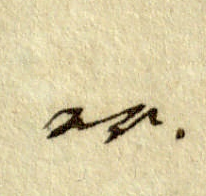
er¬
